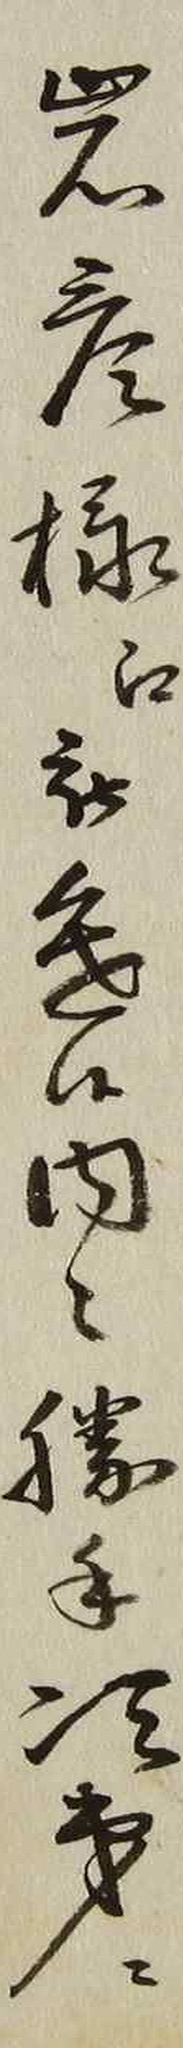岩彦様江被遣候内々勝手次第ニ
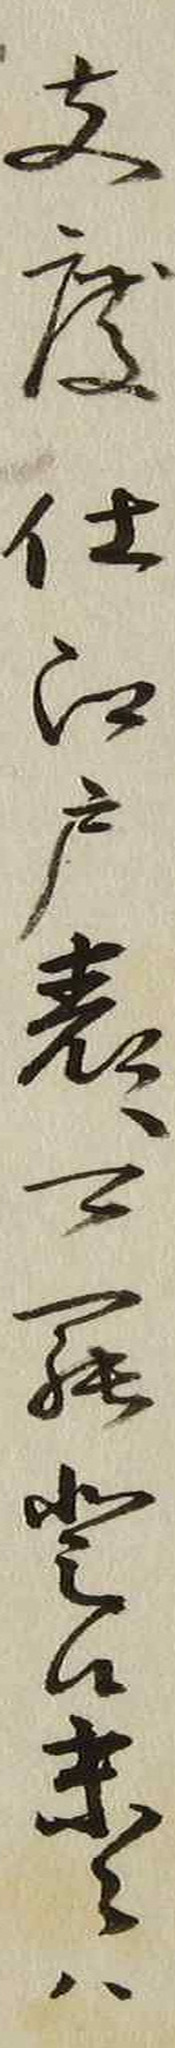支度仕江戸表へ可罷登候末々ハ
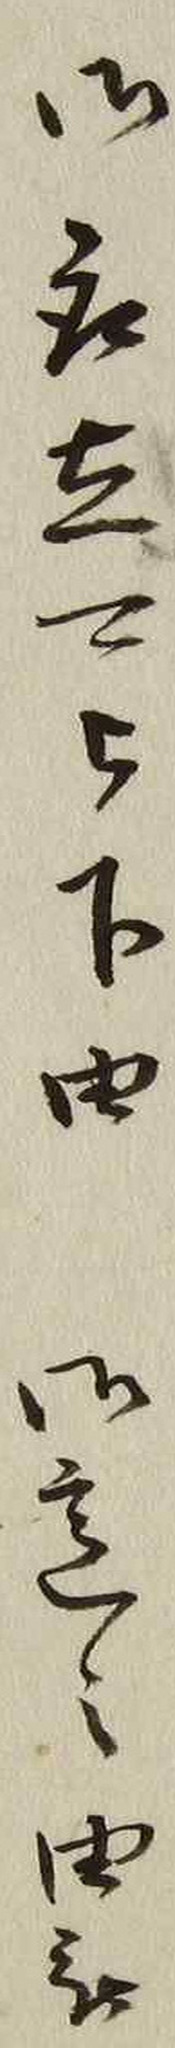御取立可被下由御意之由被
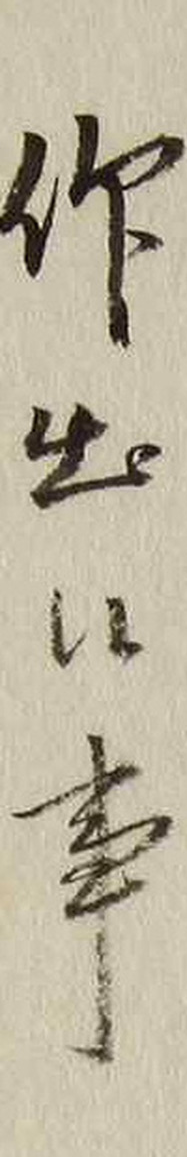仰出候事
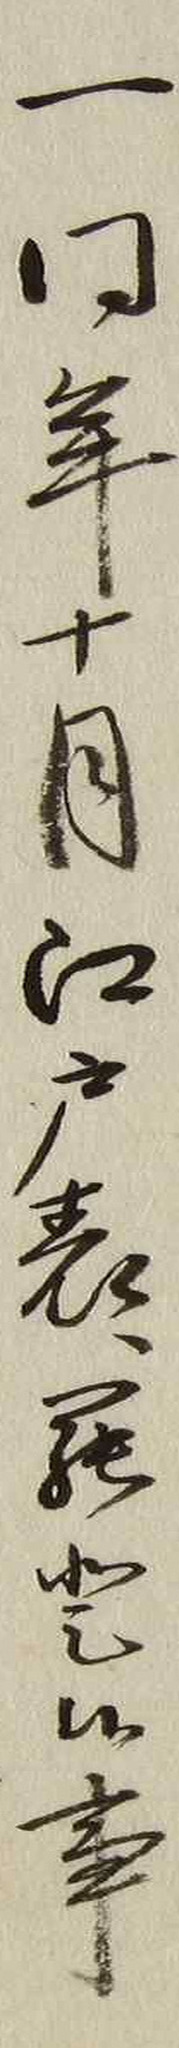一同年十月江戸表へ罷登候事
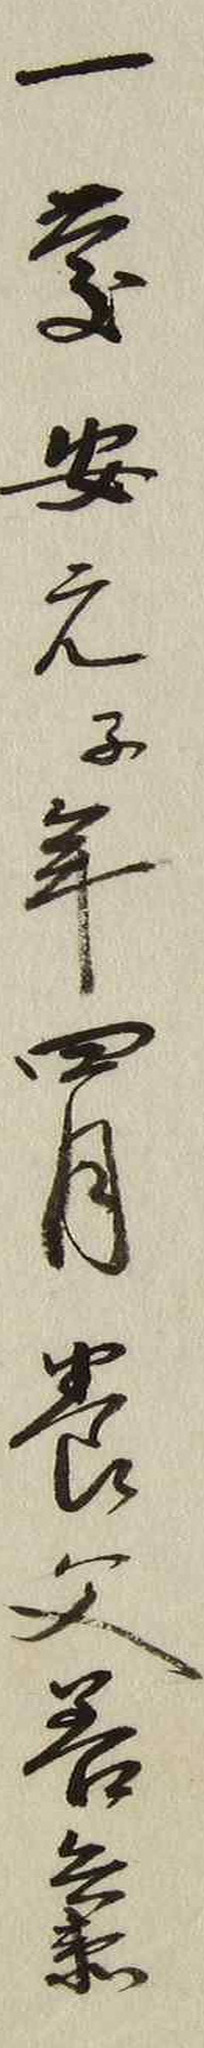一慶安元子年四月養父善兵衛
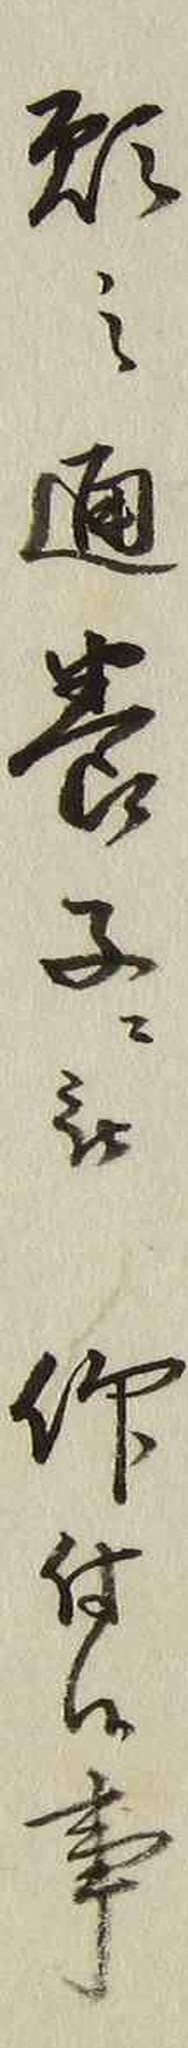願之通養子ニ被仰付候事
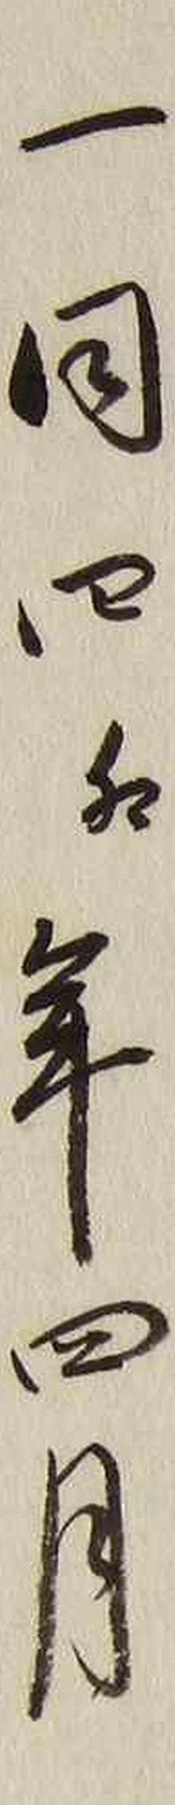一同四卯年四月
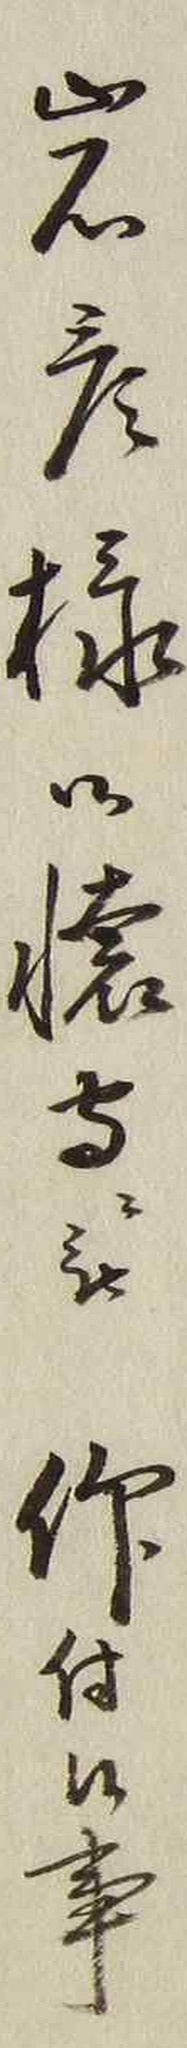岩彦様御懐守ニ被仰付候事
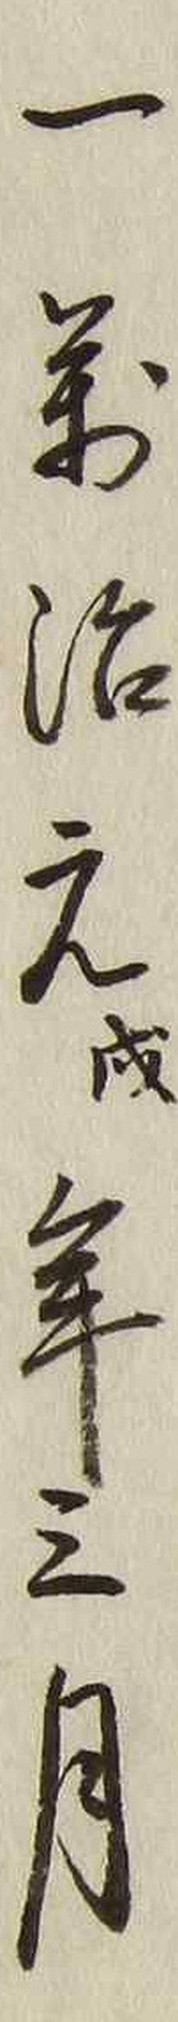一万治元戌年三月

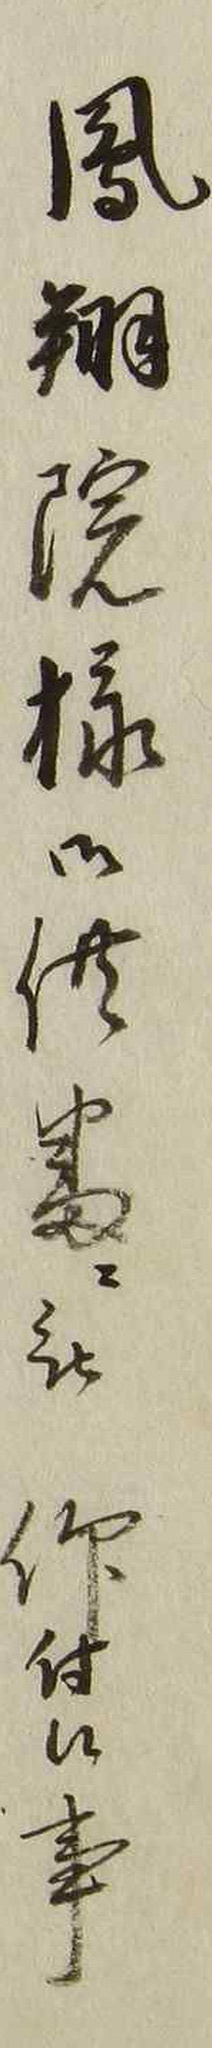鳳翔院様御供番ニ被仰付候事
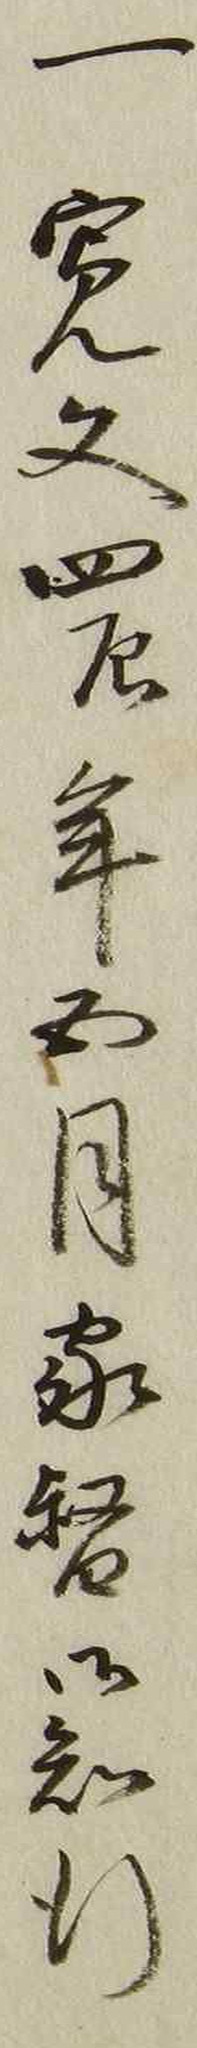一寛文四辰年五月家督御知行
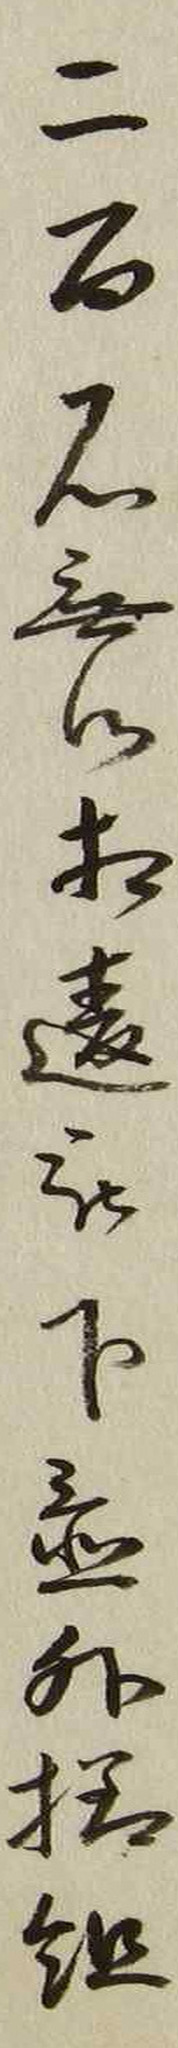二百石無御相違被我下置外様組
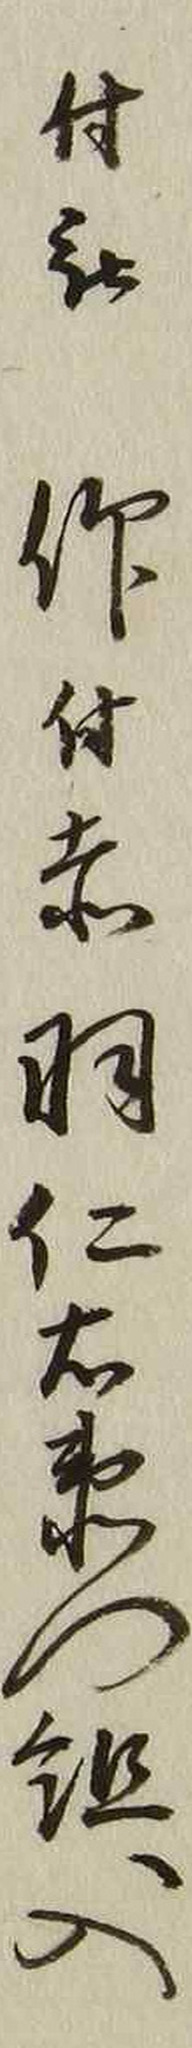付被仰付赤羽仁右衛門組へ入
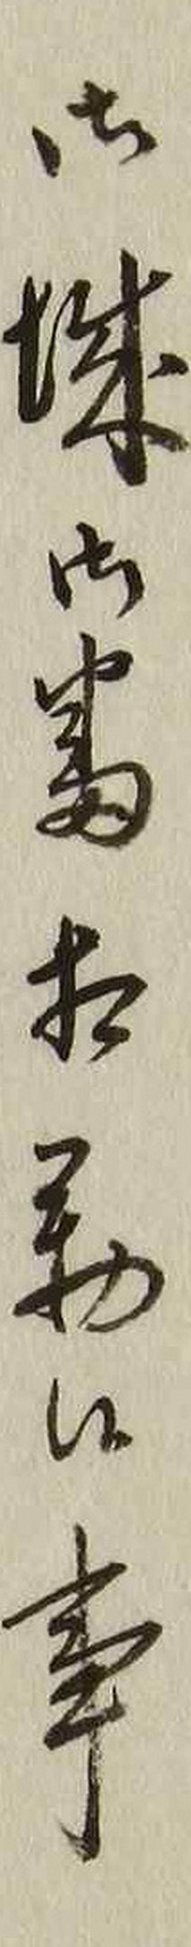御城御番相勤候事
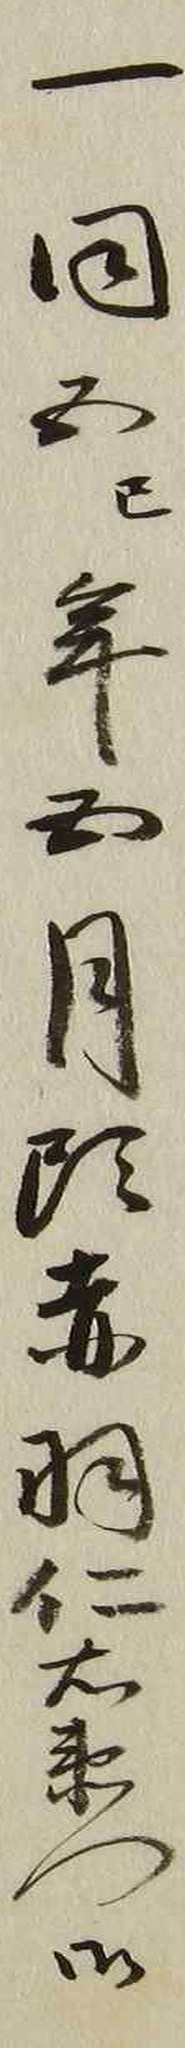一同五巳年五月頭赤羽仁右衛門御
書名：諸士系譜　巻之149　そ之部2
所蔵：会津若松市立会津図書館
